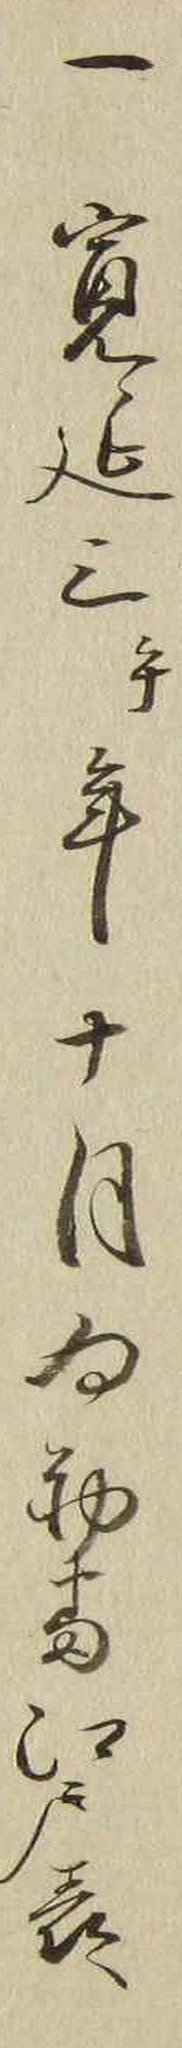一寛延三午年十月為勤番江戸表ヘ
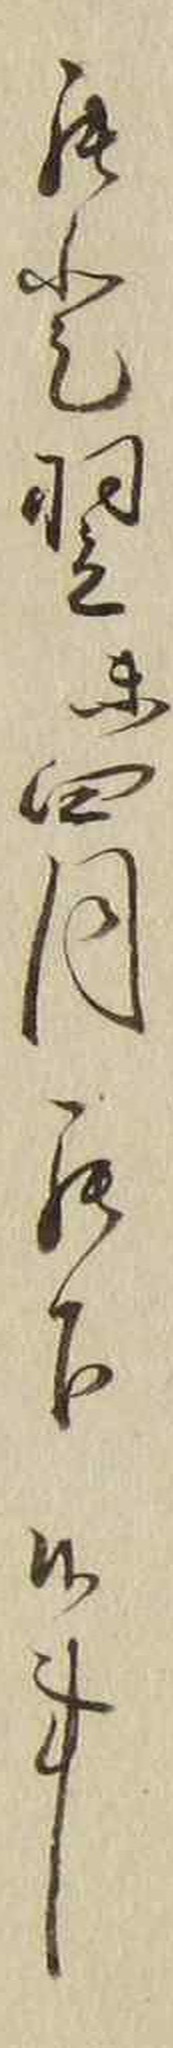罷登翌未四月罷下候事

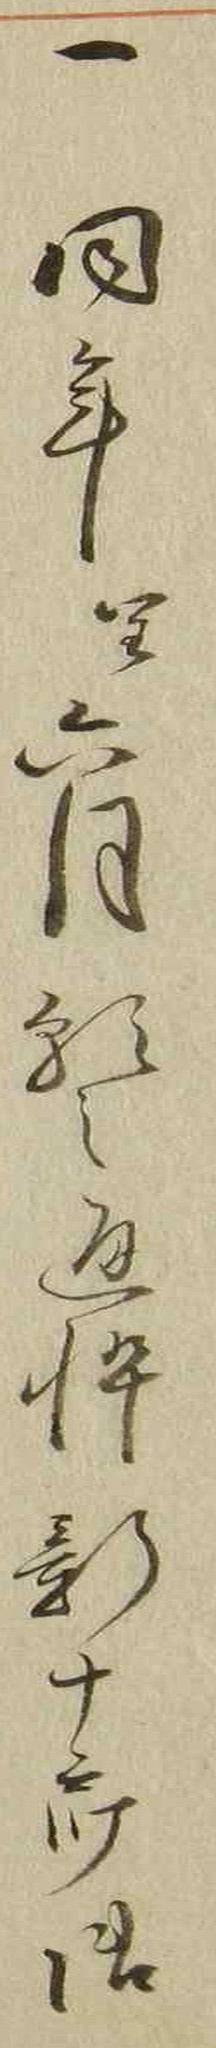一同年閏六月願之通忰新十郎御
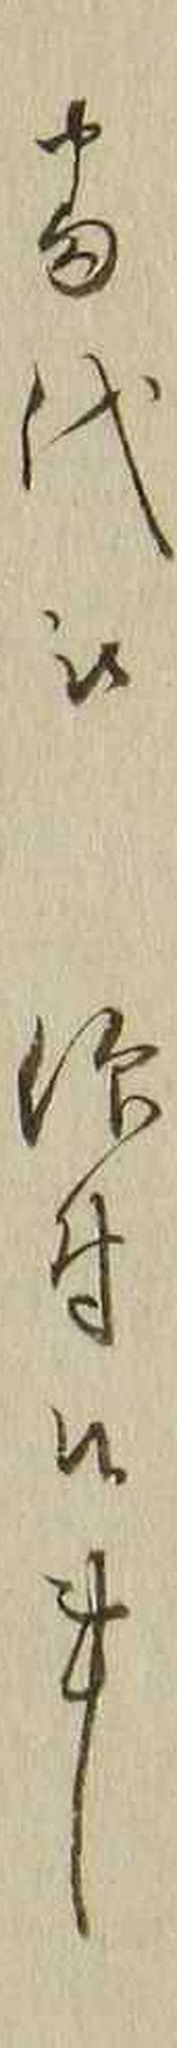番代被仰付候事
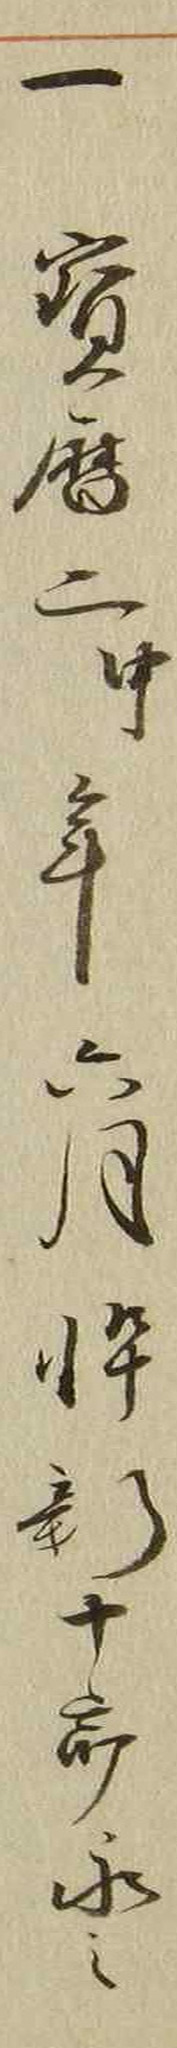一宝暦二申年六月忰新十郎永之
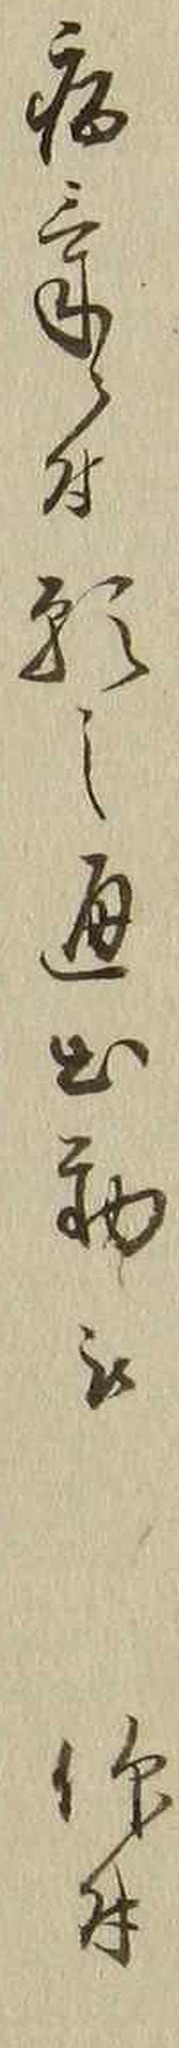病気ニ付願之通出勤被仰付
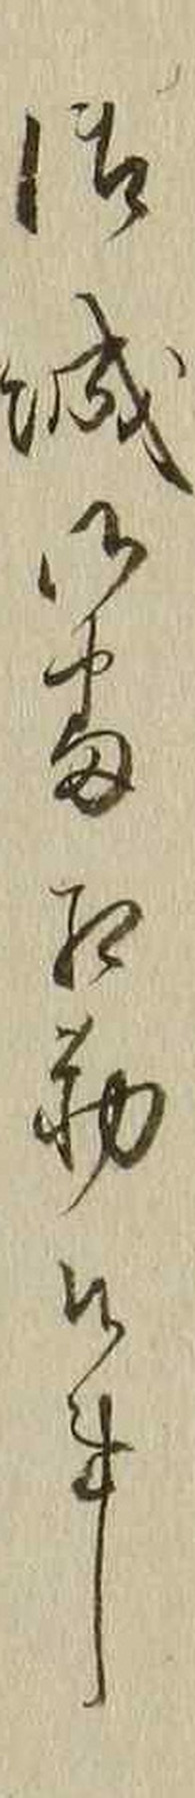御城御番相勤候事
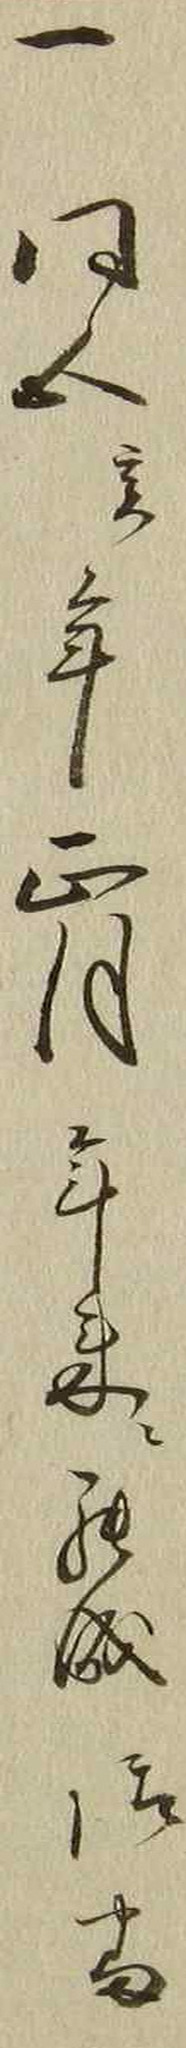一同五亥年正月年来ニ罷成御番
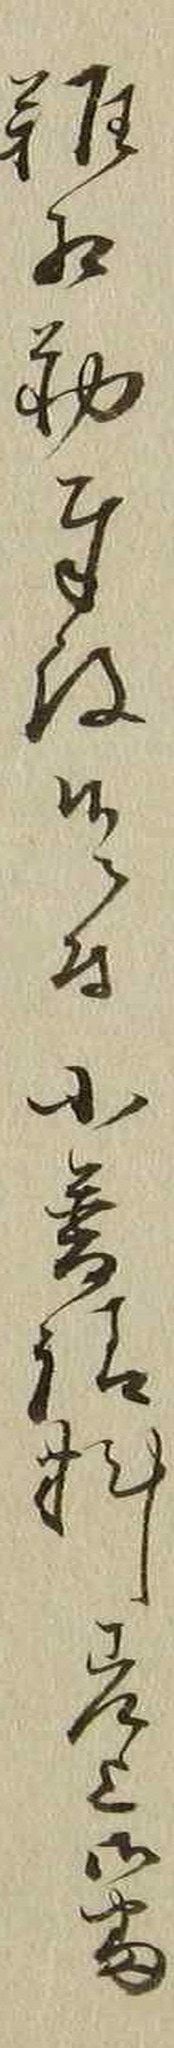難相勤奉存候ニ付事小普請料差上御番
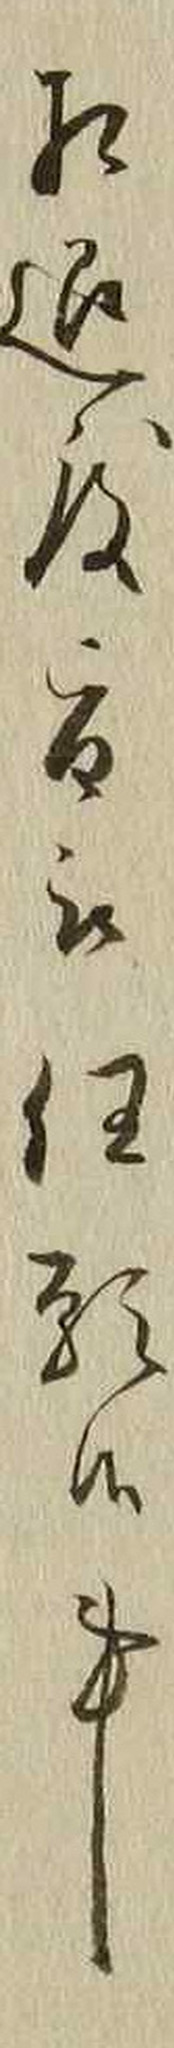相退度旨被任願候事
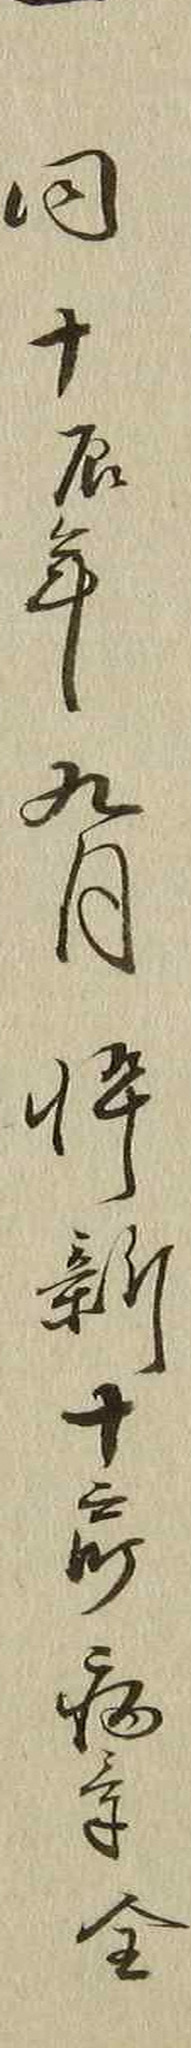一同十辰年九月忰新十郎病気全
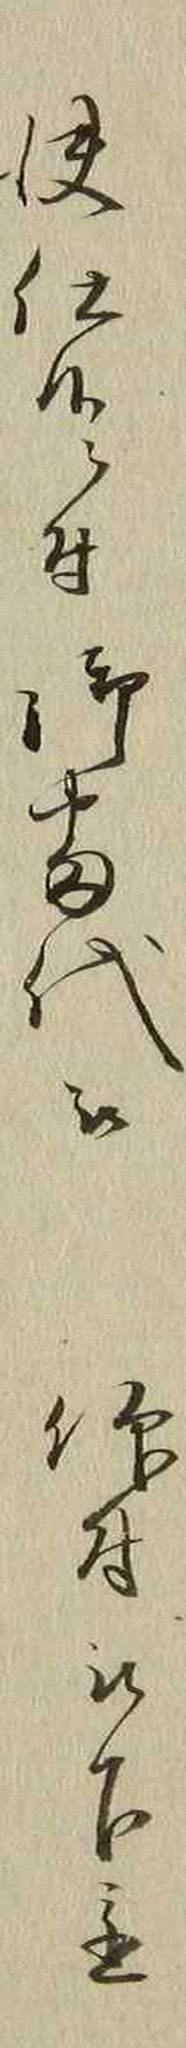快仕候ニ付御番代被仰付被下置
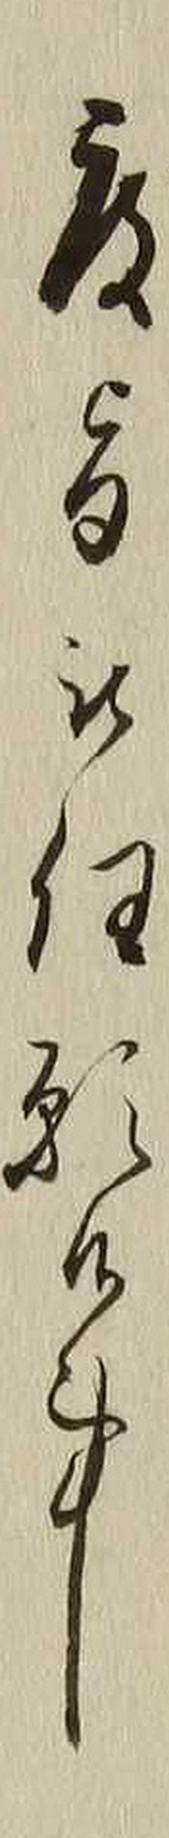度旨被任願候事
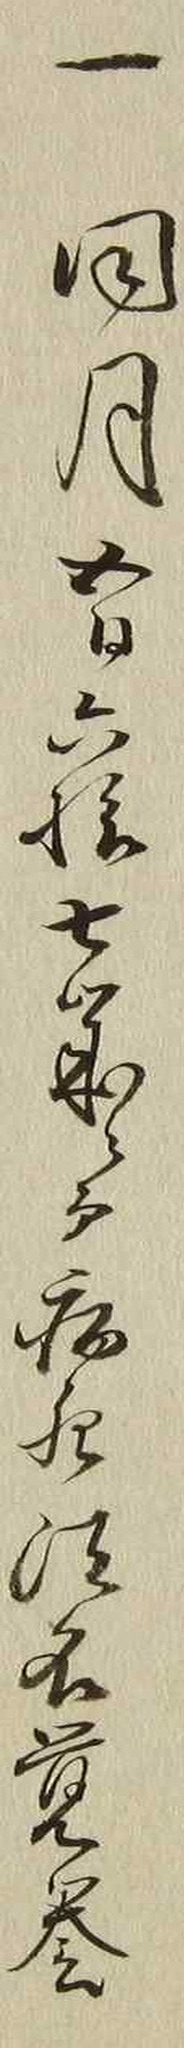一同月五日六拾七歳ニ而病死法名覚誉
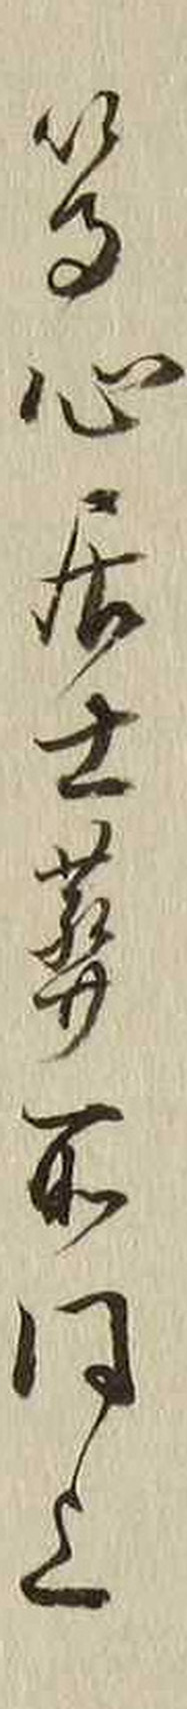篤心居士葬所同上
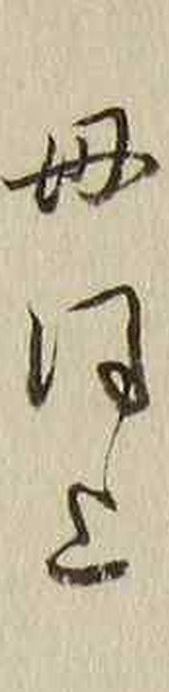母同上
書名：諸士系譜　巻之68　を之部2
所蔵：会津若松市立会津図書館
